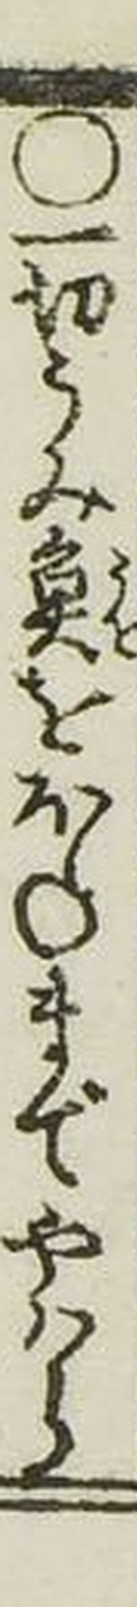〇一切うみ魚をほねまでやはら
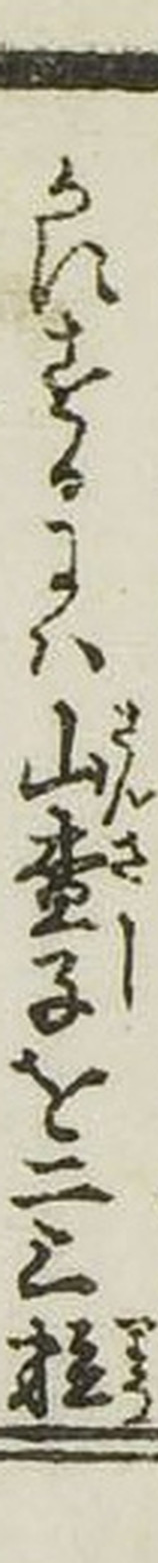かにするには山査子を二三粒
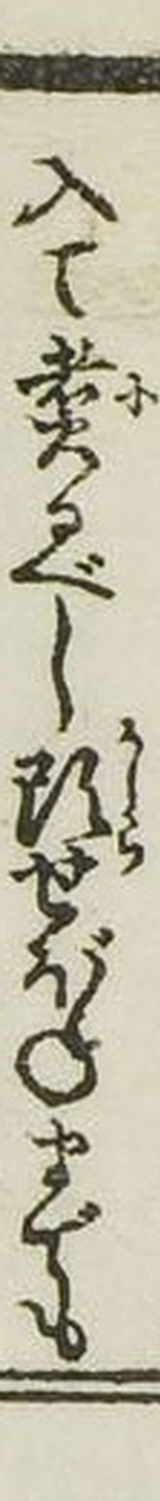入て煮るべし頭せぼねまでも
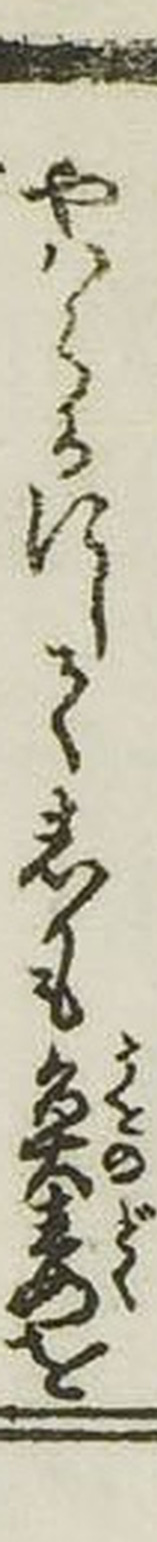やはらかにしてしかも魚毒を
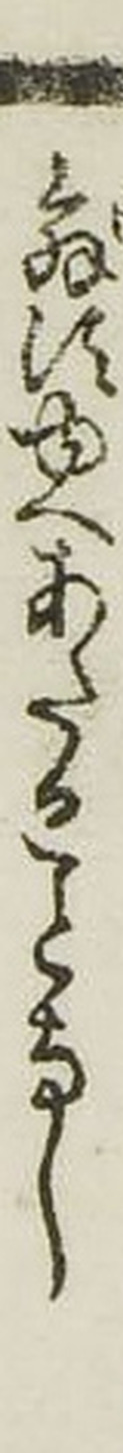解すゆへあたることなし
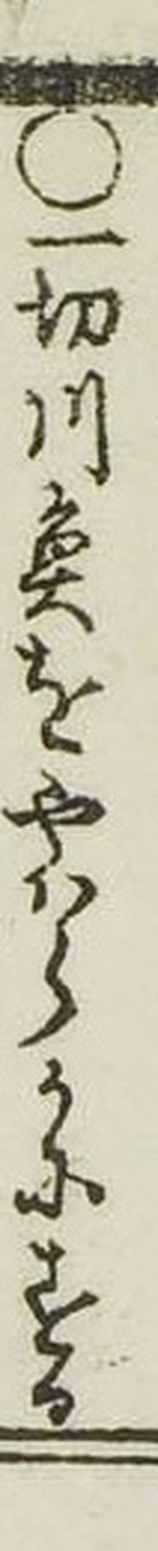〇一切川魚をやはらかにする
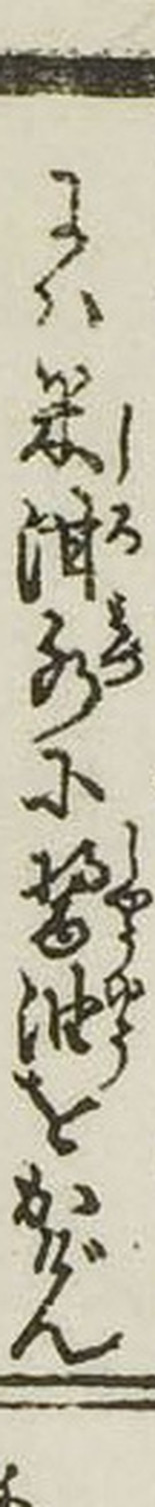には米泔水に醤油をかげん
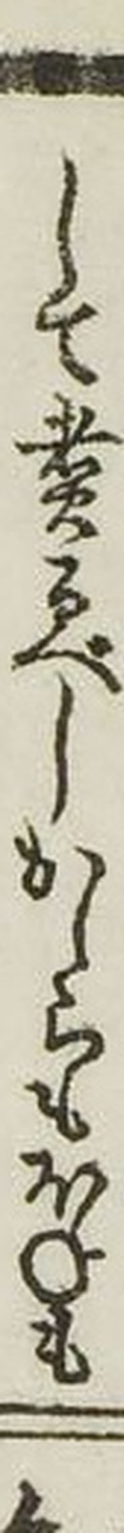して煮るべしかしらもほねも
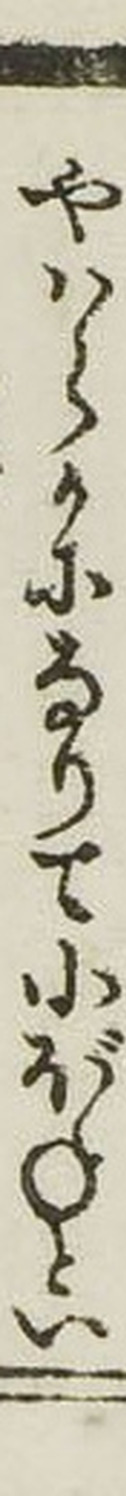やはらかになりで小ぼねとい
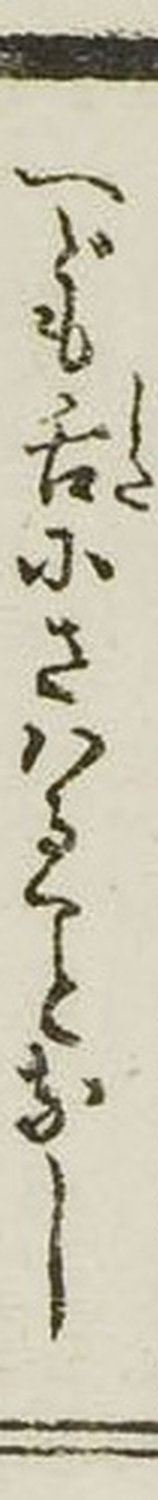へども舌にさはることなし
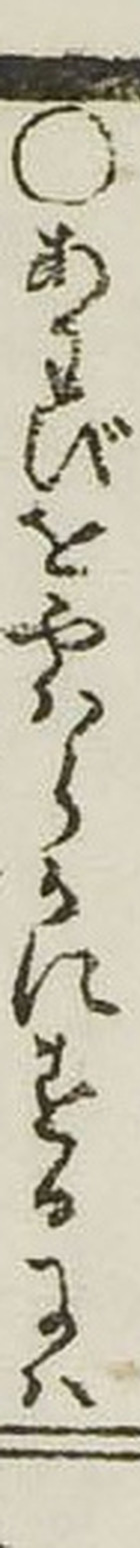〇あわびをやはらかにするには
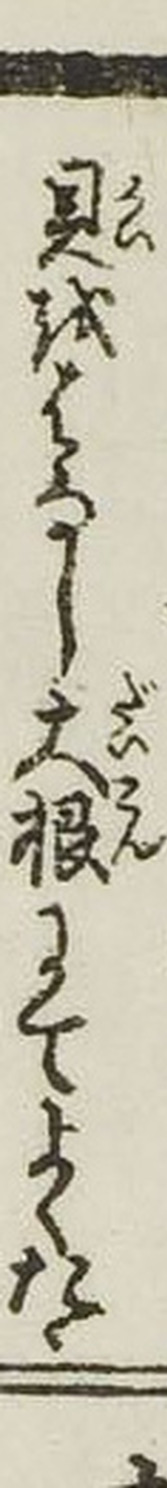貝をはなし大根にてよくたゝ
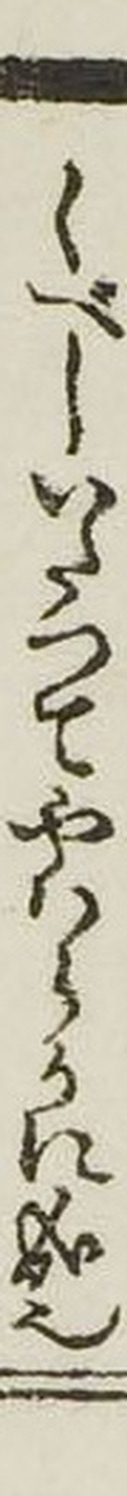くべしいたつてやはらかに成也
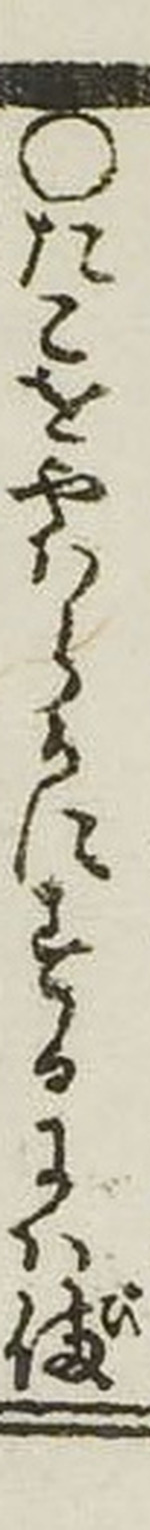〇たこをやはらかにするには備
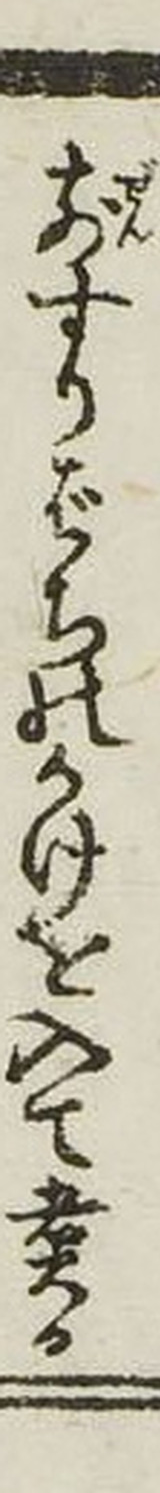前すりばちのかけを入て煮る
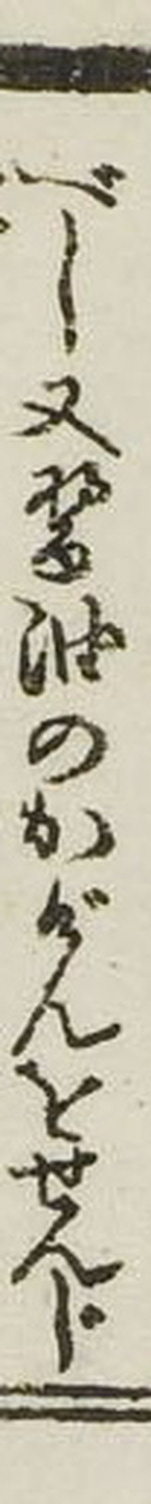べし又醤油のかげんをせんじ
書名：商人書翰便覧
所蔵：東京学芸大学教育コンテンツアーカイブ
